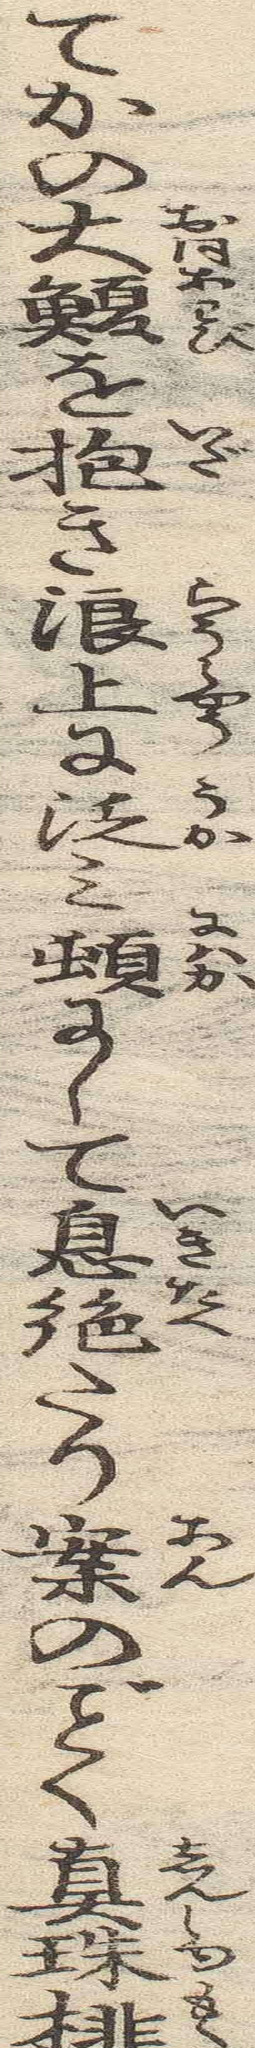てかの大鰒を抱き浪上に泛み頓にして息絶たり案のごとく真珠棑
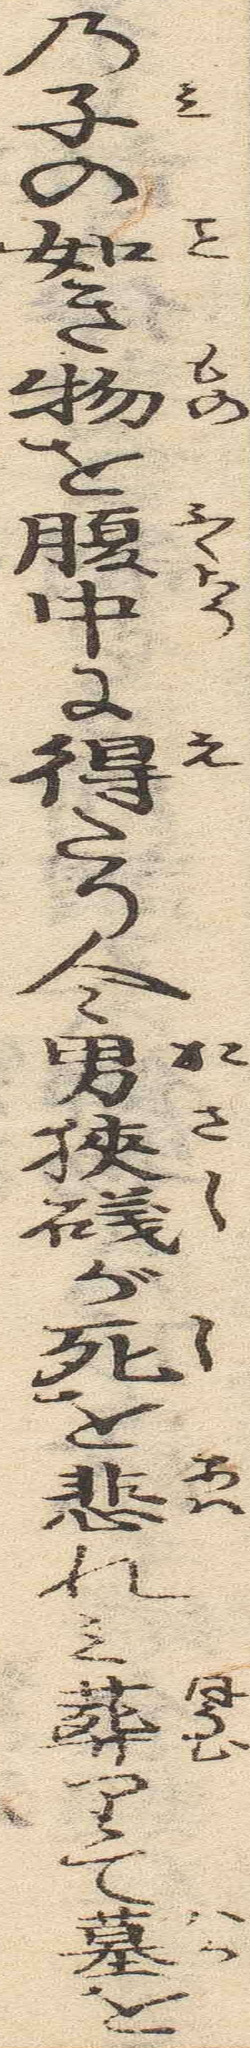の子の如き物を腹中に得たり人々男狭礒が死を悲れみ葬りて墓を
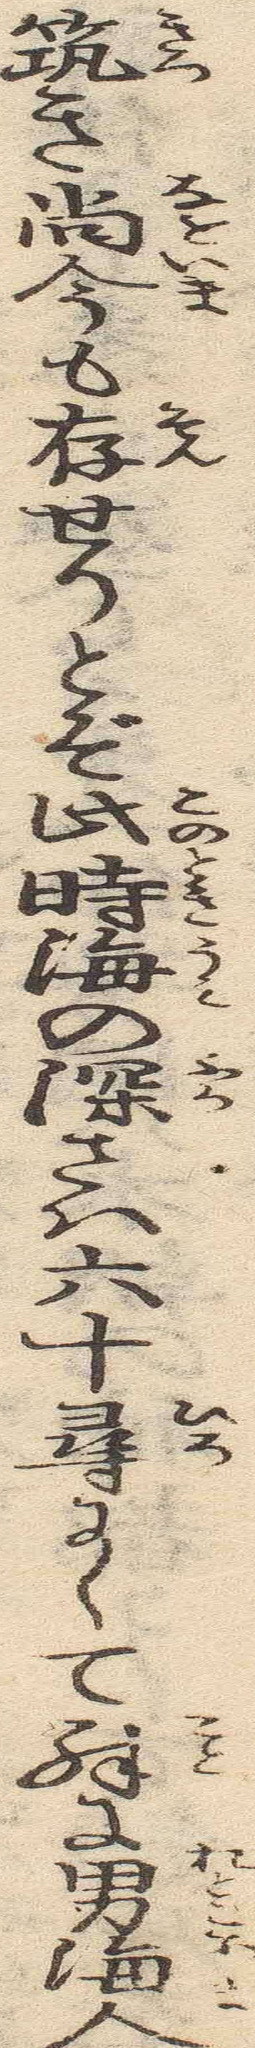筑き尚今も存せりとぞ此時海の深さは六十尋にして殊に男海人
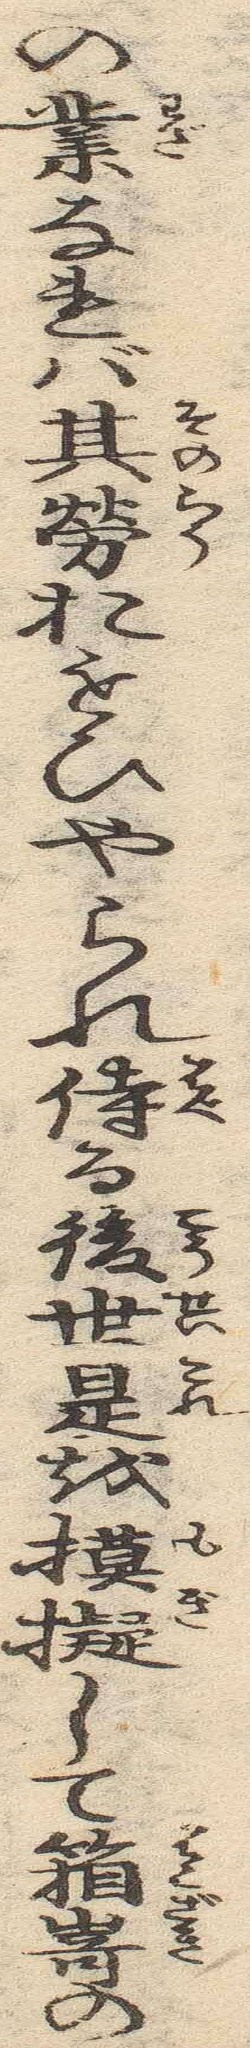の業なれば其労おもひやられ侍る後世是を摸擬して箱崎の
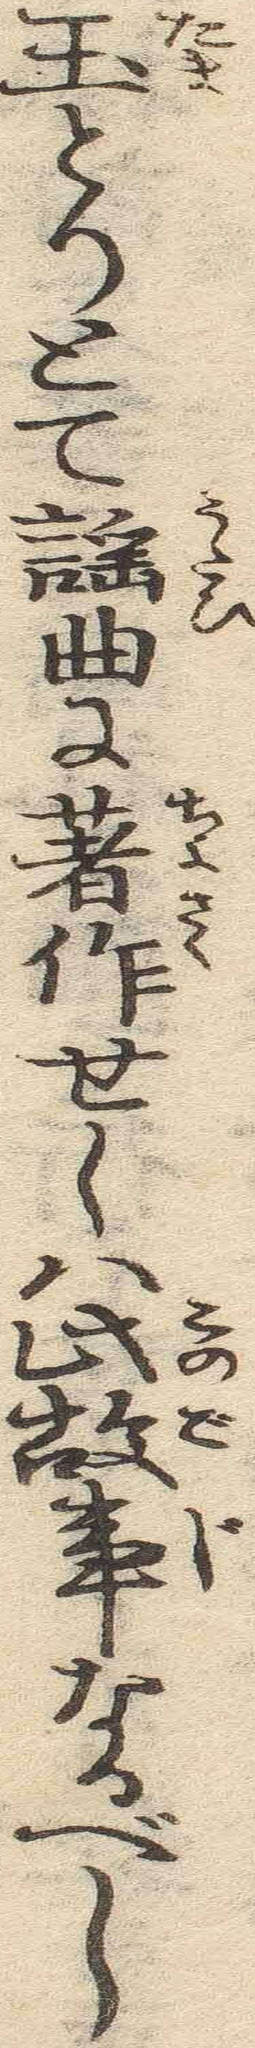玉とりとて謡曲に著作せしは此故事なるべし
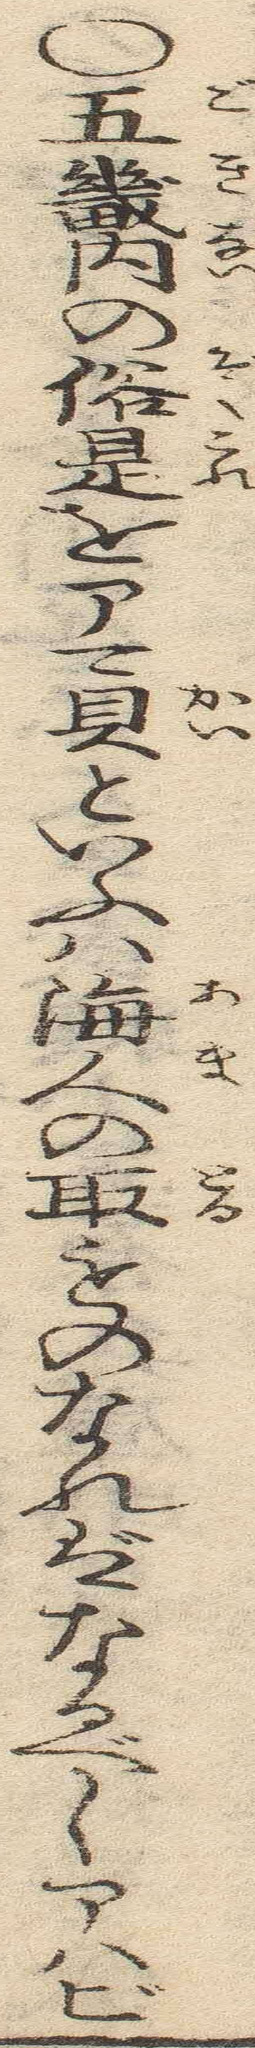○五幾内の俗是をアマ貝といふは海人の取ものなればなるべしアハビ
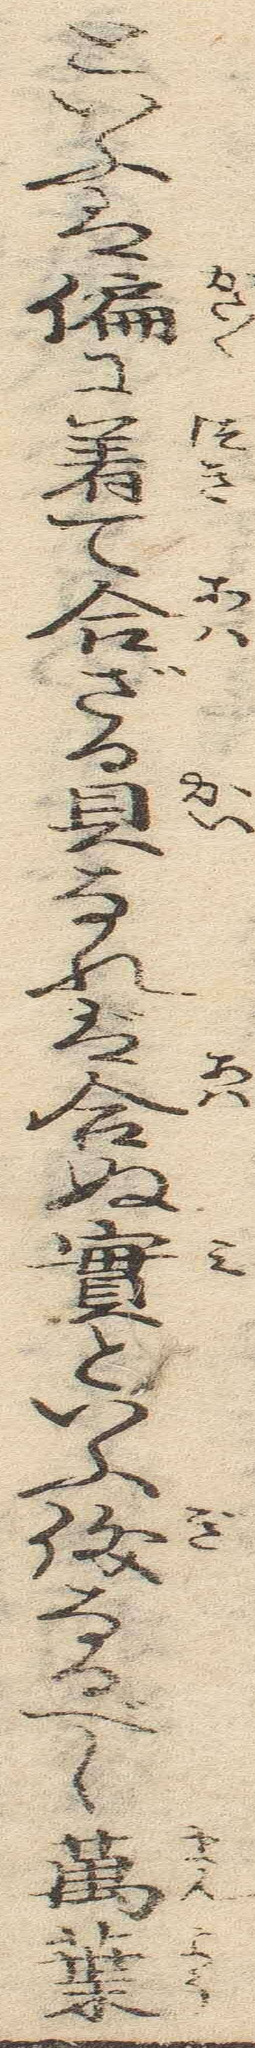といふは偏に着て合ざる貝なれば合ぬ実といふ儀なるべし万葉
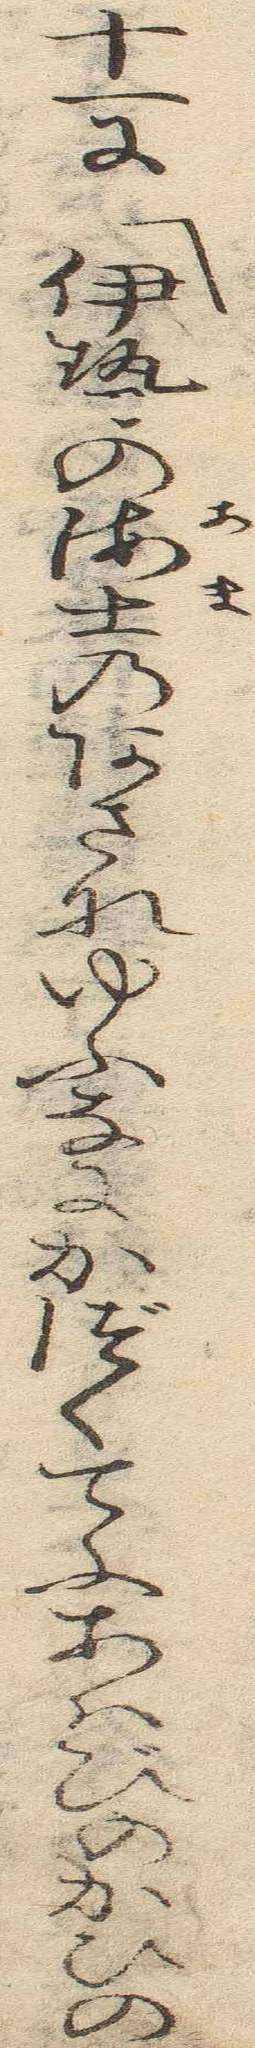十一に〽伊勢の海士のあさなゆふなにかづくてふあはびのかひの
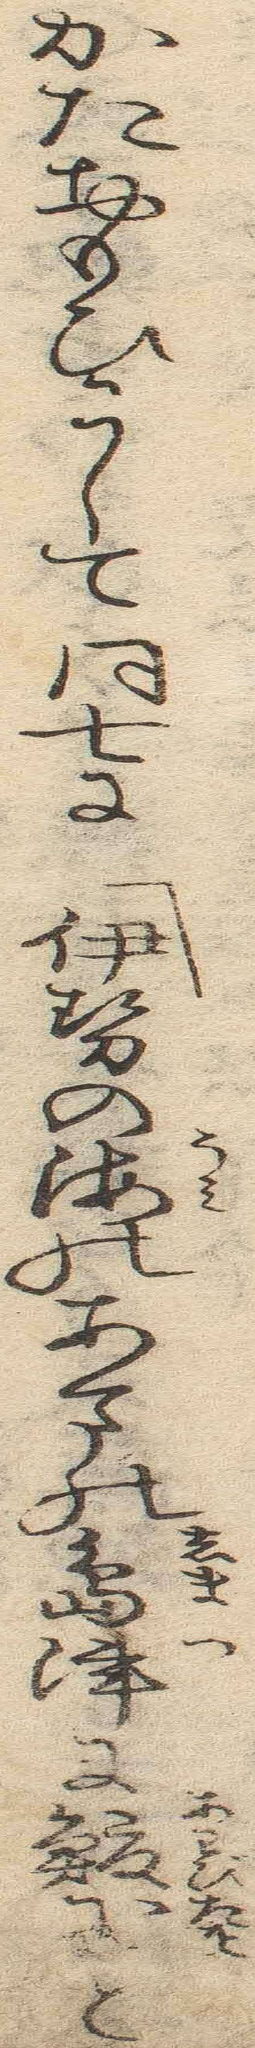かたおもひして同七に〽︎伊勢の海のあまの島津に鰒玉と
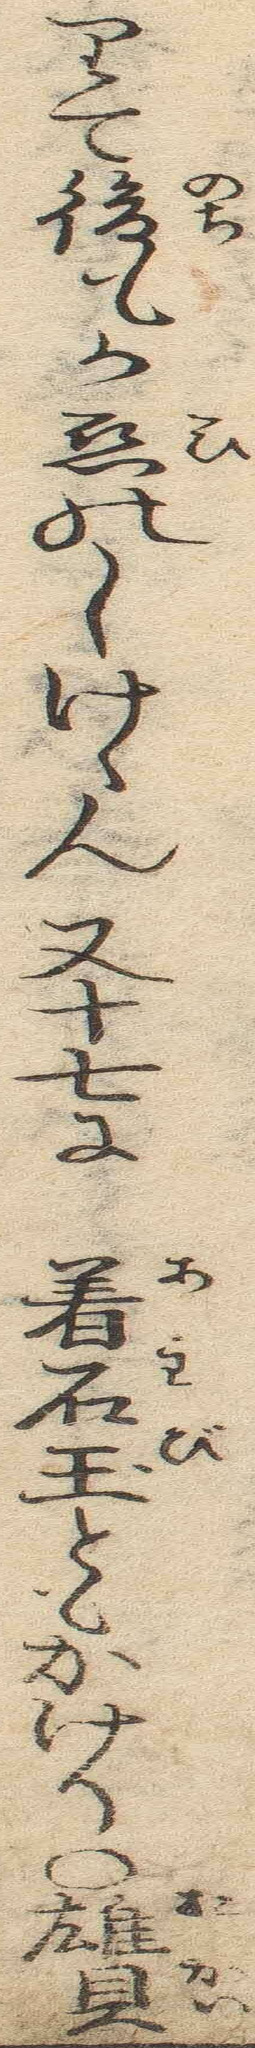りて後もか恋のしけゝん又十七に着石玉ともかけり○雄貝
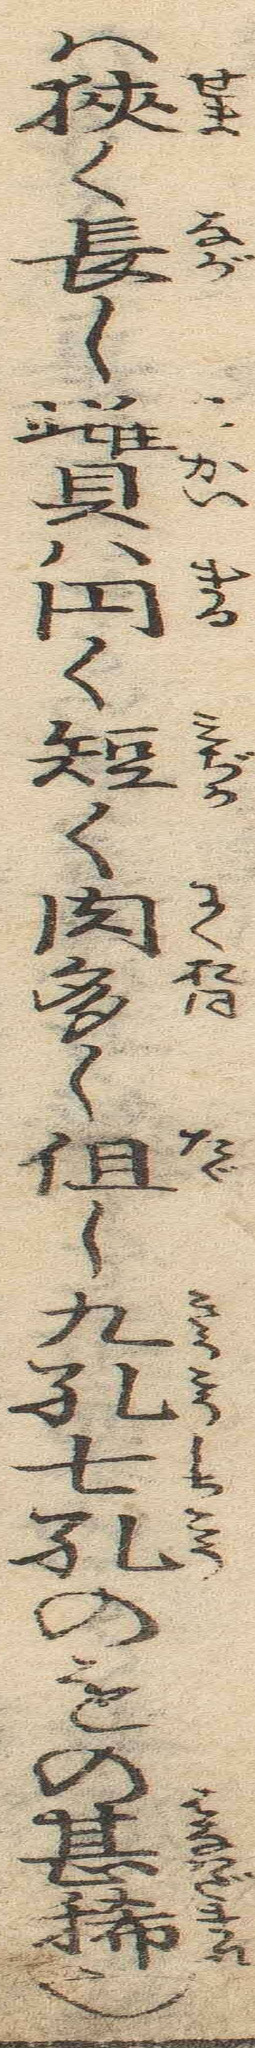は狭く長し雌貝は円く短く肉多し但し九孔七孔のもの甚稀也
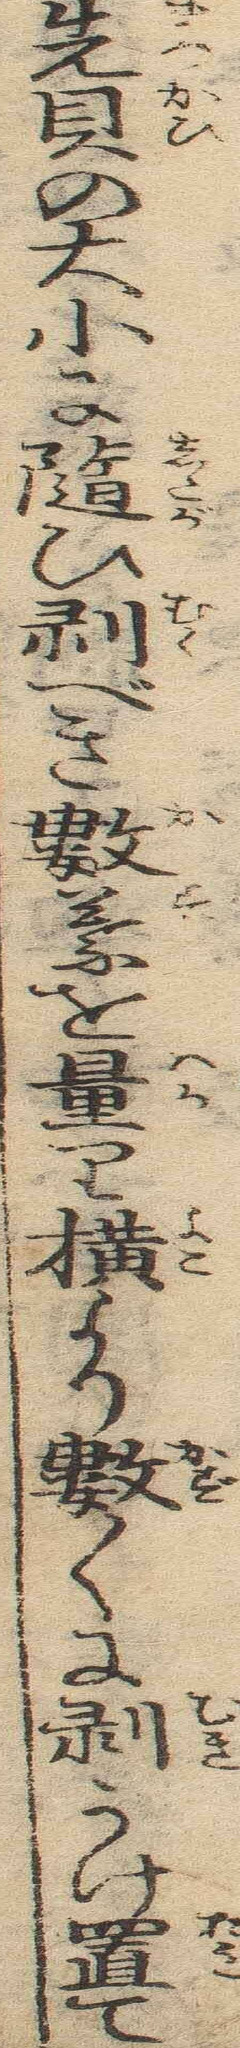先貝の大小に随ひ剥べき数葉を量り横より数〳〵に剥かけ置て

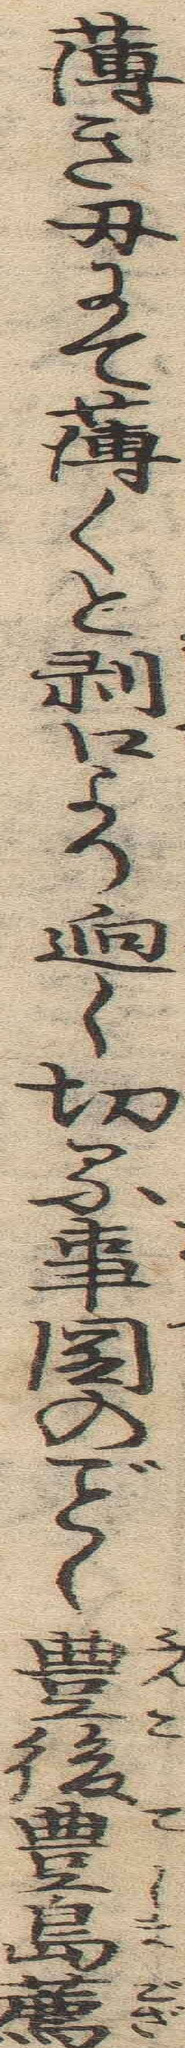薄き刃にて薄〳〵と剥口より廻し切る事図のごとし豊後豊島薦
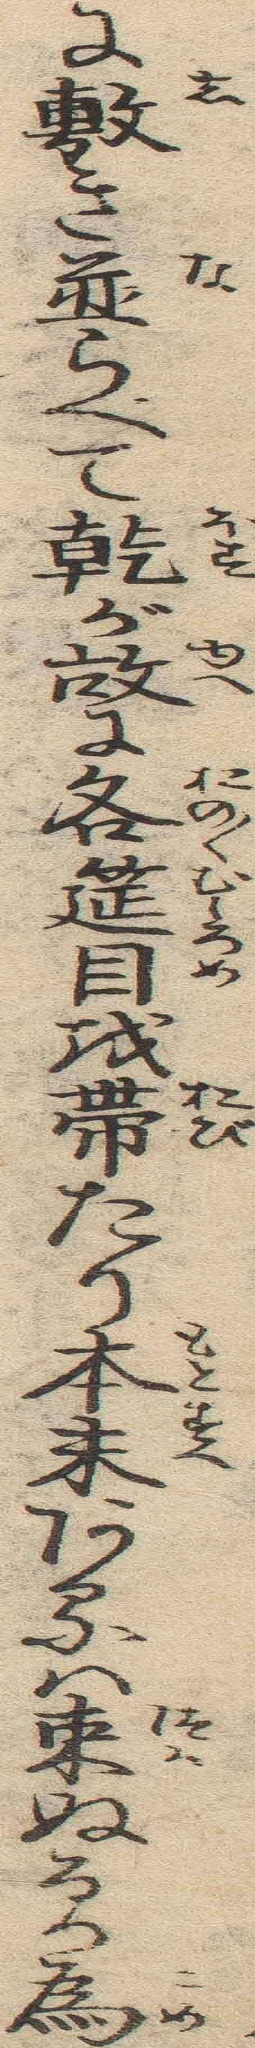に敷き並らべて乾が故に各筵目を帯たり本末あるは束ぬるか為
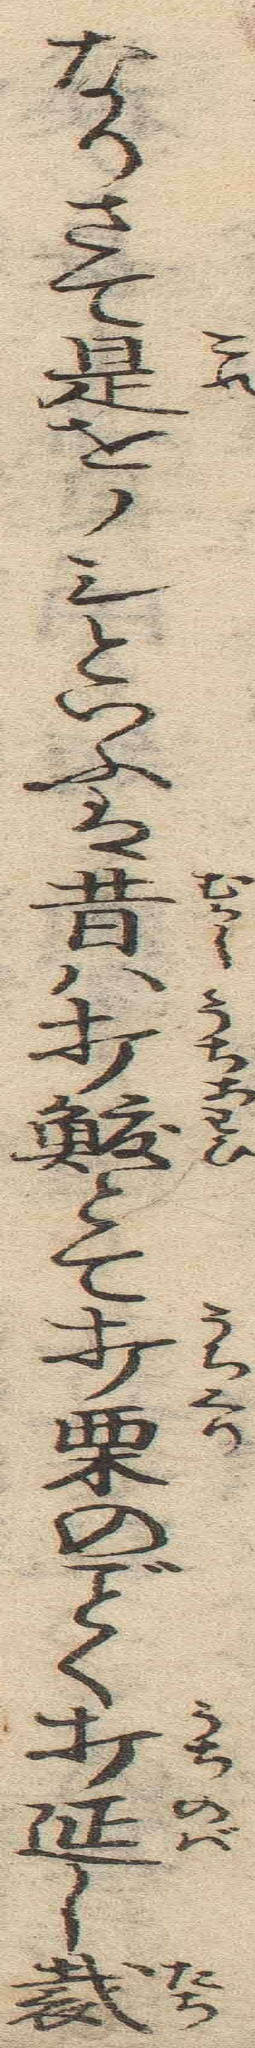なりさて是をノシといふは昔は打鰒とて打栗のごとく打延し裁
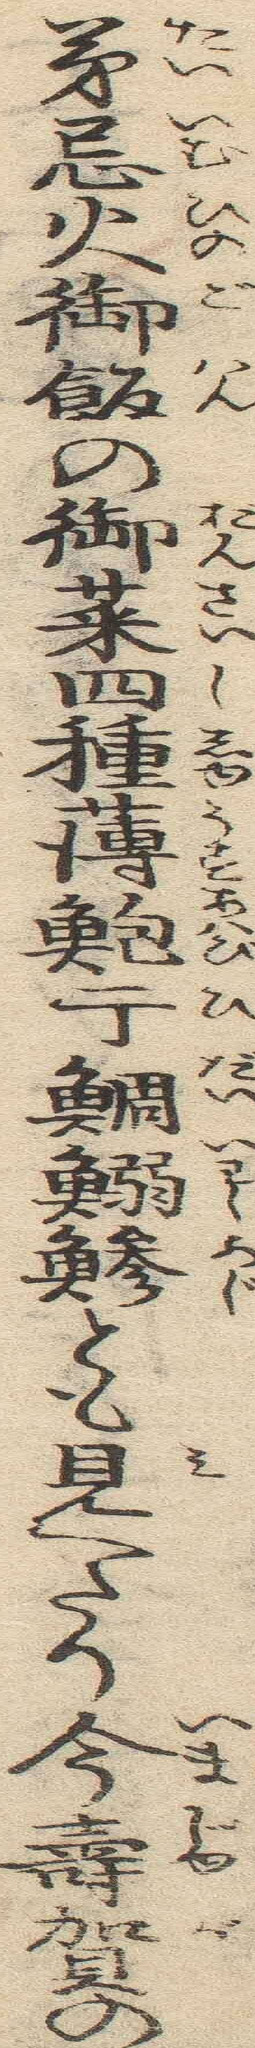第忌火御飯の御菜四種薄鮑干鯛鰯鯵とも見へたり今寿賀の
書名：日本山海名産図会
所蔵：東京学芸大学附属図書館 国文学研究資料館
